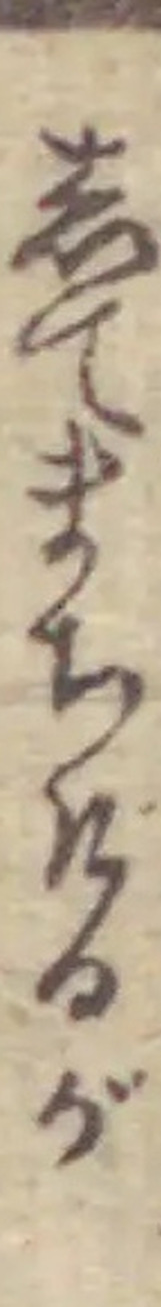してまちけるが
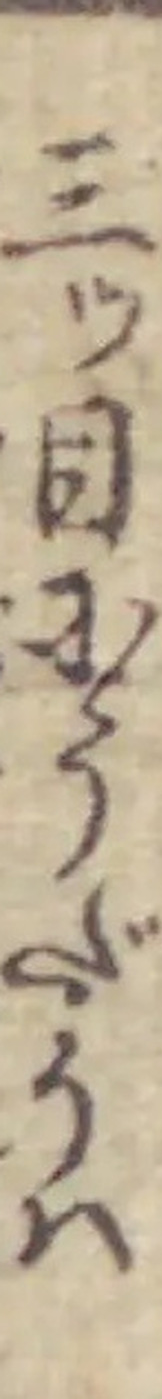三つ目にうだうは
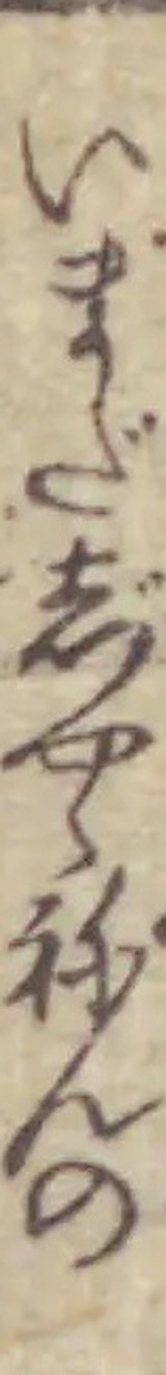いまだじやくねんの
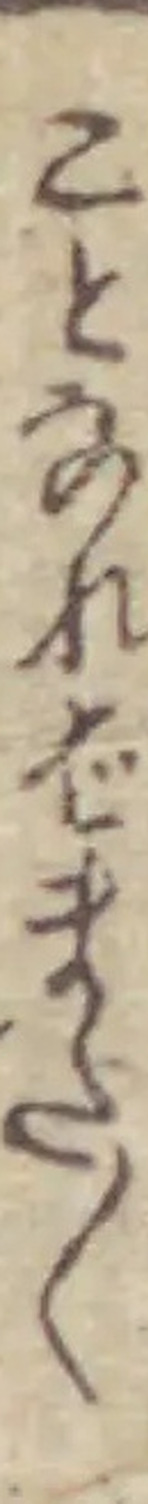ことなればまた〳〵
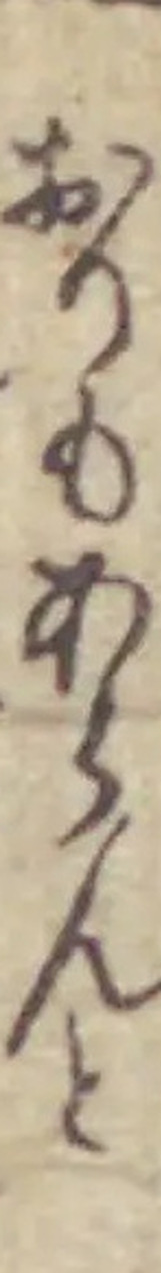おりもあらんと
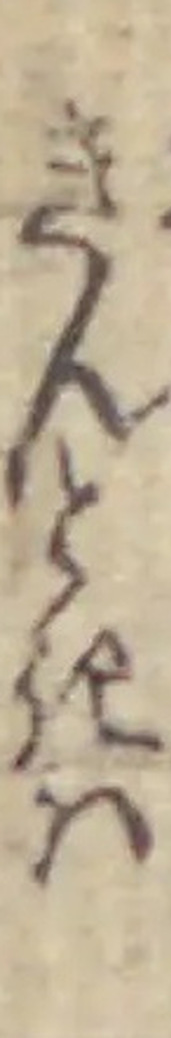きんときは
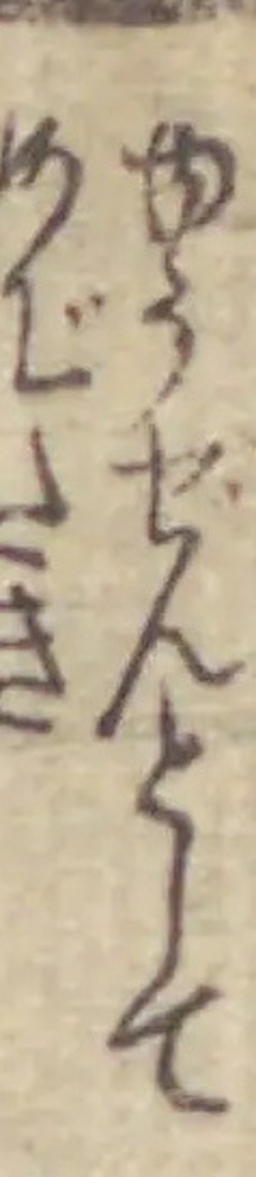めでたき
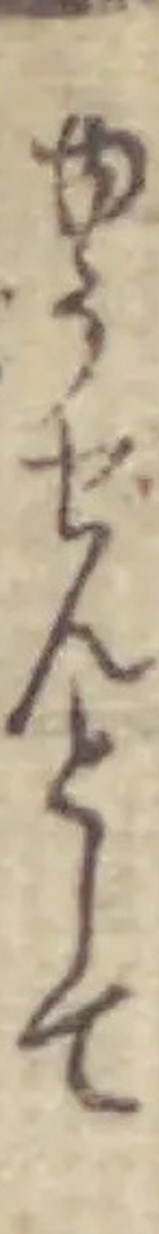ゆうぜんとして
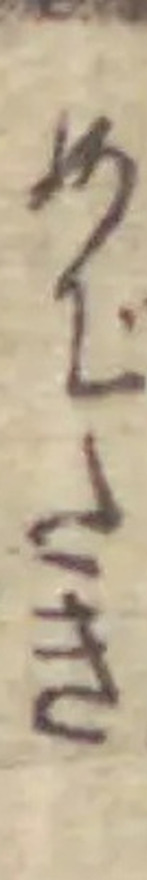めでたき
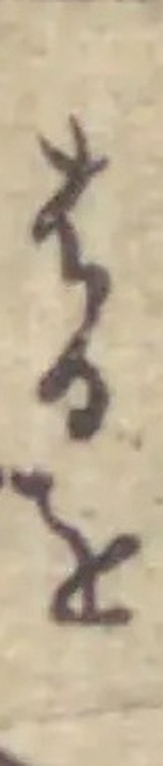はるを
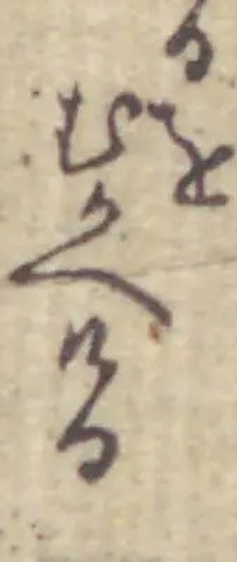むかへける
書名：大昔化物双紙 2巻
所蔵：国立国会図書館 National Diet Library, JAPAN
